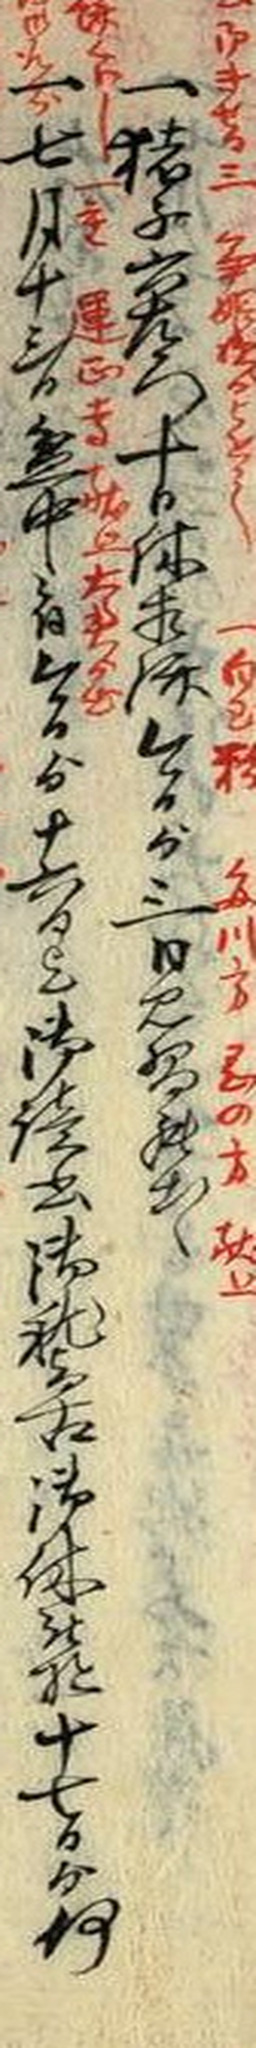一七月十三日盆中ニ付今日ゟ十六日迄御読書御稽古御休被遊十七日ゟ何
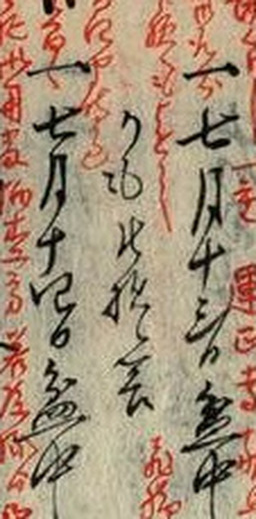かも被遊候筈
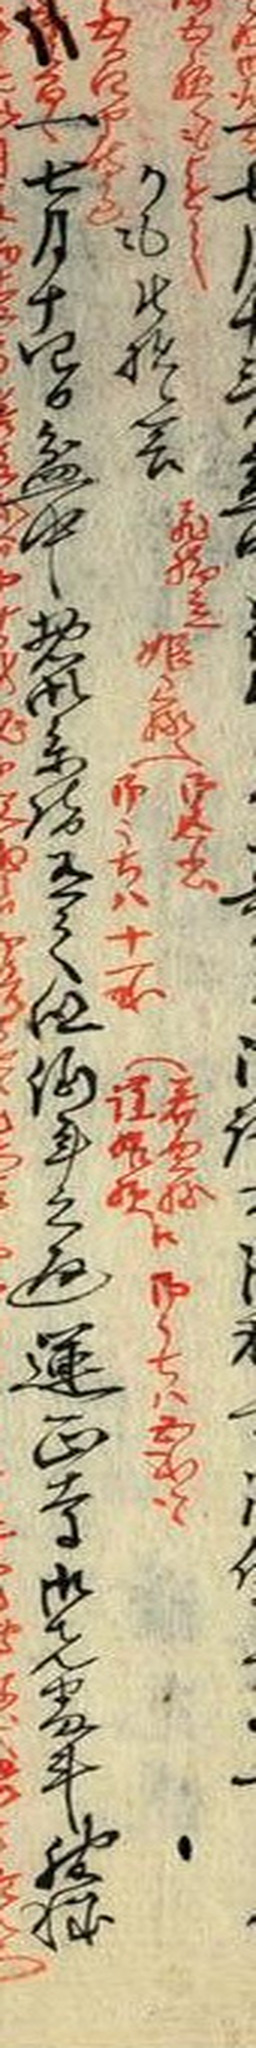一七月十四日盆中惣御参詣有之但例年之通運正寺御先番斗服穢
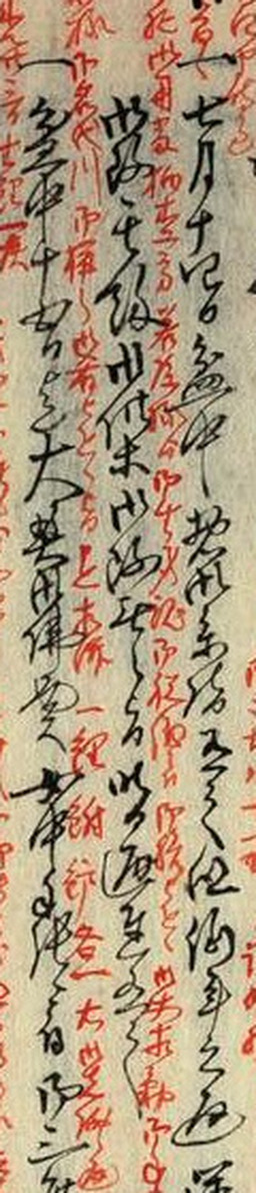御改其余御供等御改無之旨昨日通達有之
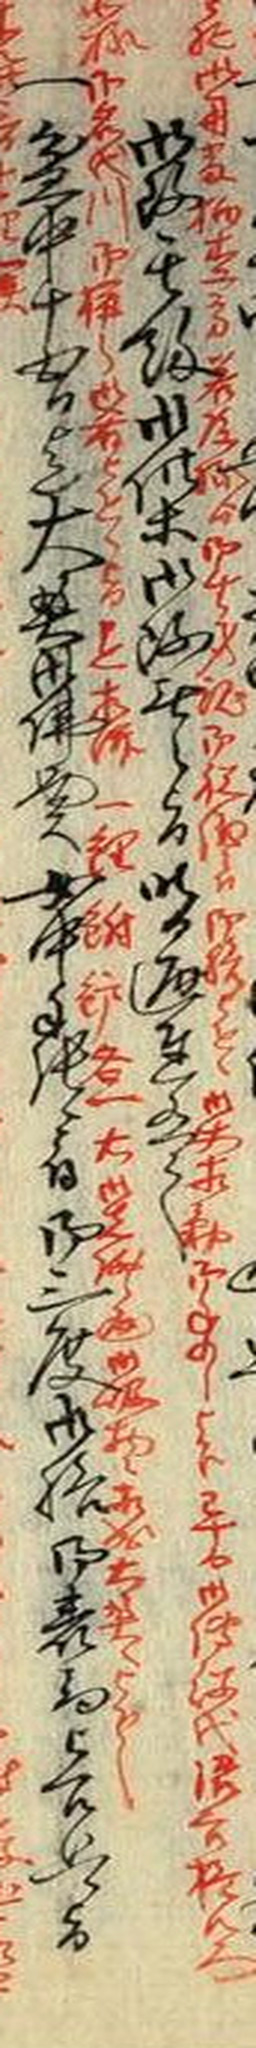一盆中十五日迄大奥御仏殿女中手張候ニ付御三度御膳御表ニ而被召上候旨
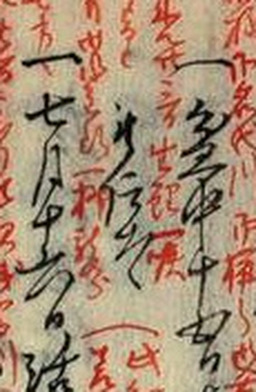被仰出候
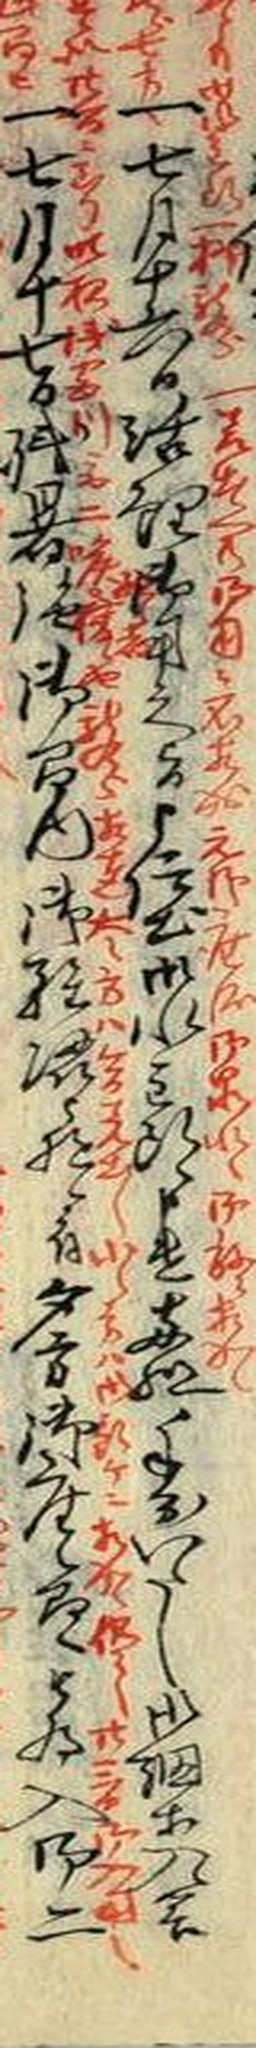一七月十七日残暑強御間内御難渋被遊候ニ付夕方御座之間へ被為入御二
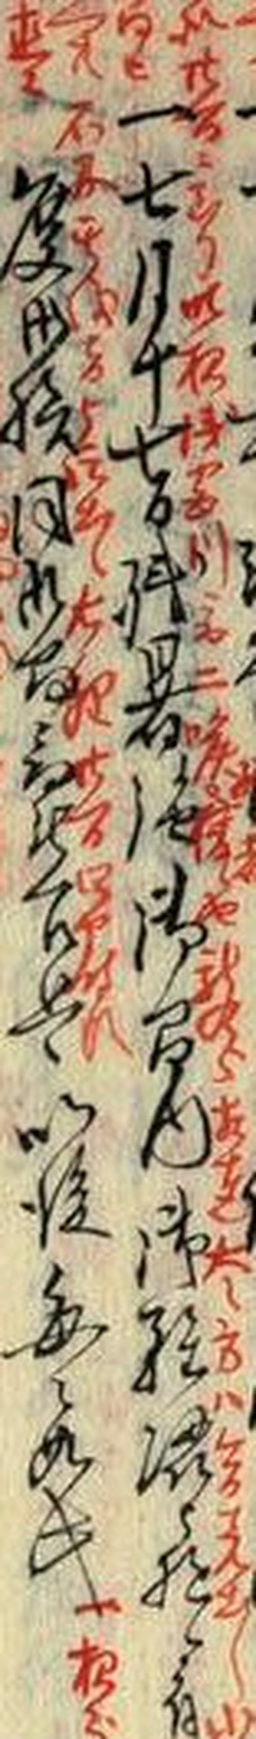度御膳同御間ニ而被召上候以後毎々如此
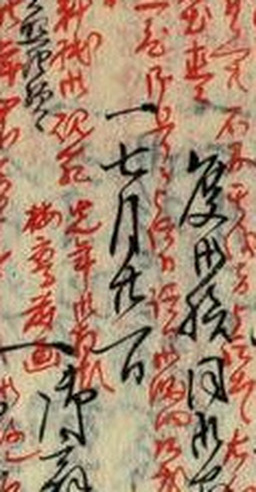一七月廿一日
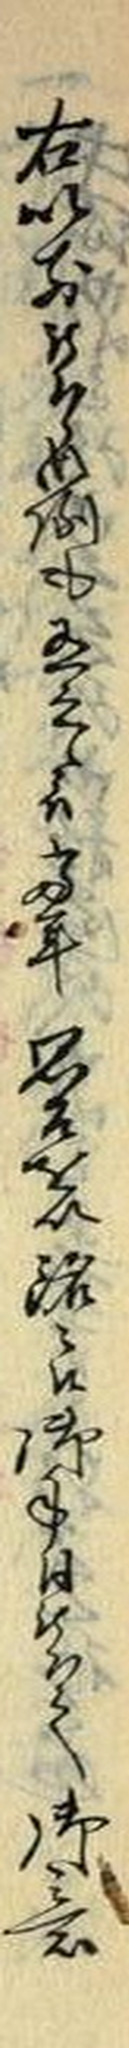右以前被下候御例も有之候ニ付当年思召を以銘々江手自被下之御意
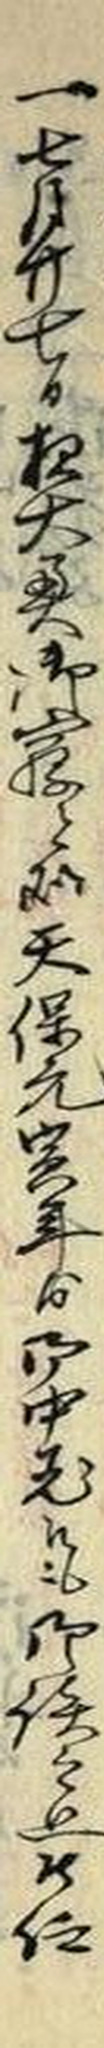一七月廿七日夜大奥御寝候処天保元寅年ゟ御中老江も御談之上被仰
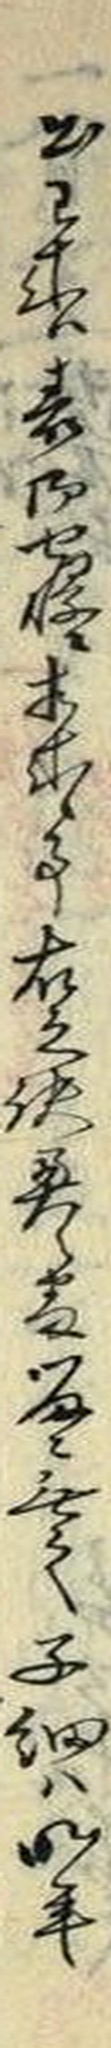出已来ハ表江御寝ニ相成候事右之訳奥之番留ニ無之子細ハ昨年
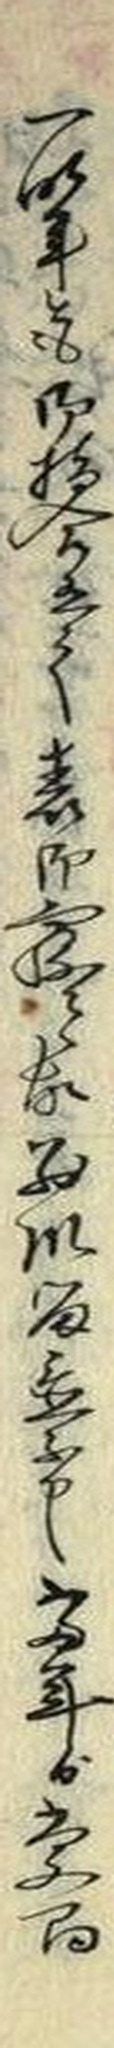一昨年とも御指合有之表御寝ニ候故別段留置不申当年ゟ尚又間
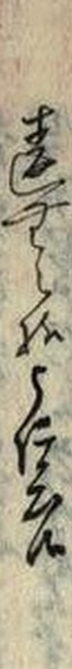違無候様被仰出候
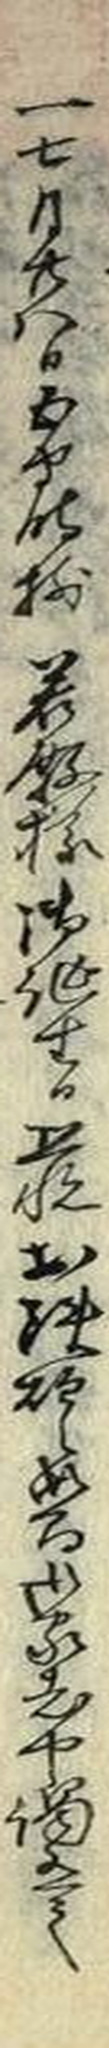一七月廿八日五半時揃若殿様御誕生日恐悦於鉄炮之御間御家老中謁有之
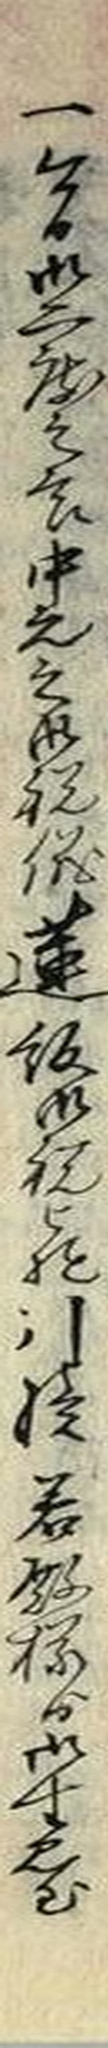一今日御二度之節中元之御祝儀蓮飯御祝被遊引続若殿様ゟ御生見玉
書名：少傅日録抄（斉承付側向頭取日記、在国）
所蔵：福井県文書館 Fukui Prefectural Archives
